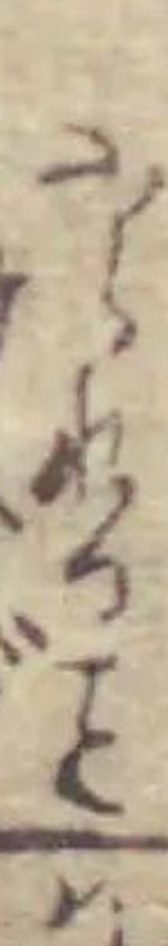みられることは
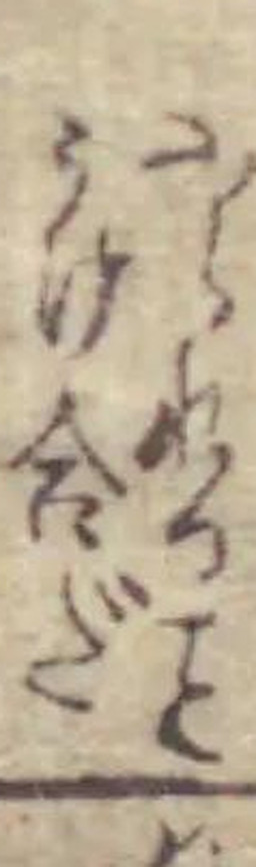うけ合だ
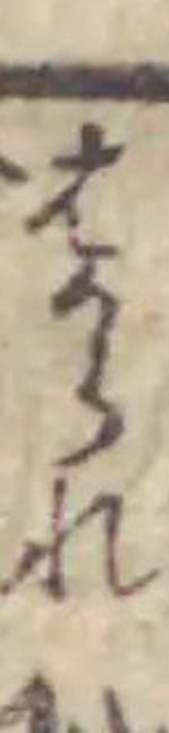はかられ
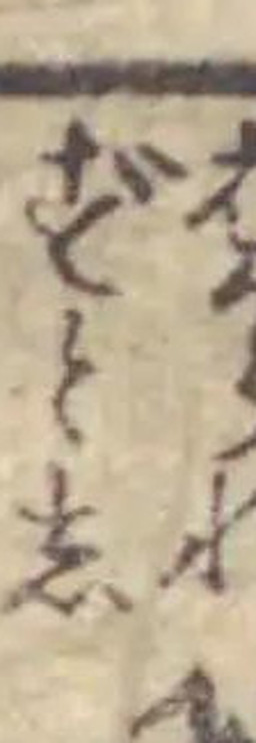ずとし
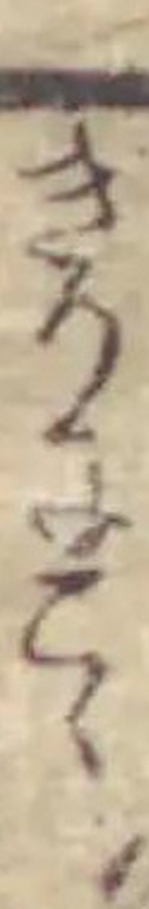きりにこゝ
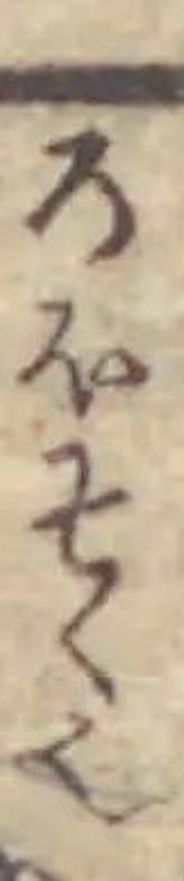ろほそく也
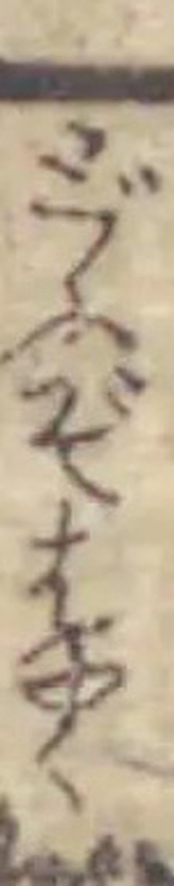どふぞはやく
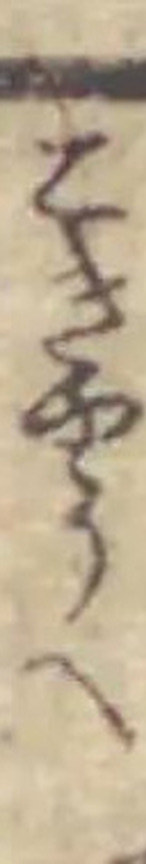こきやうへ
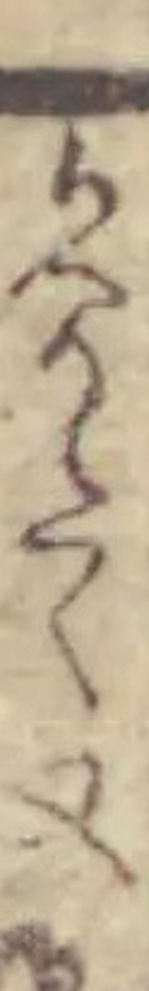かへりたく又
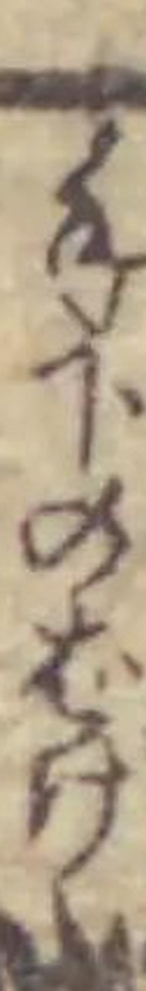手下のばけ
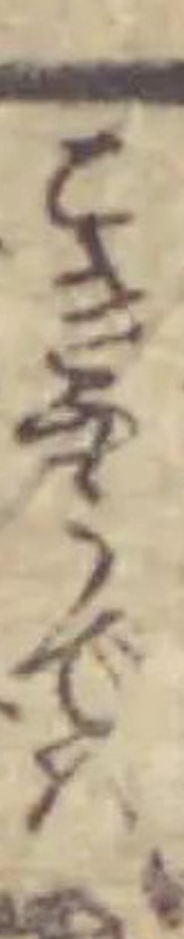こきやうでは
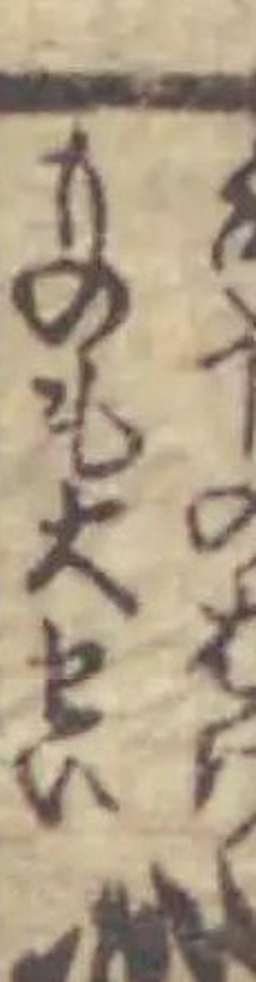ものも大せい
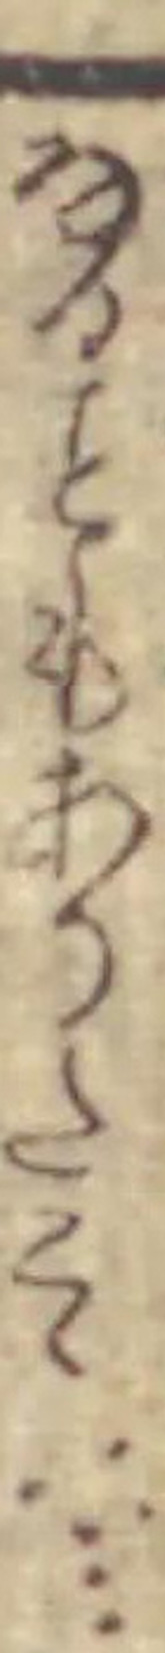なることもありたこゝ
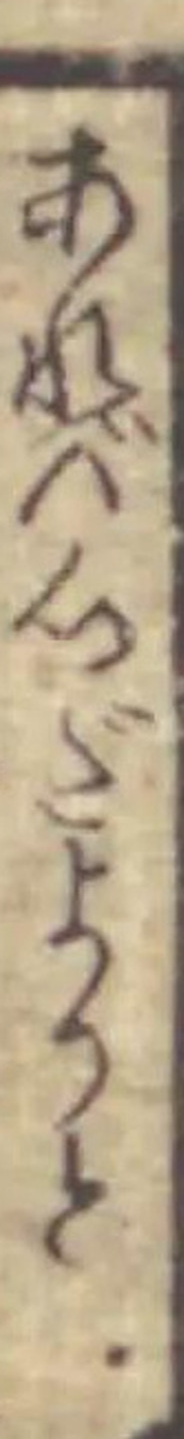あれば心だよりと
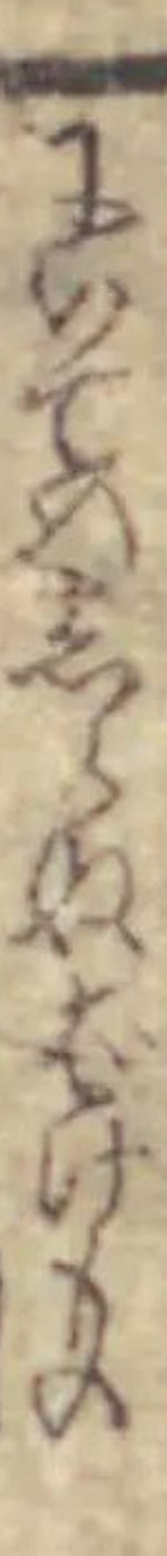にいてはしらぬばけもの
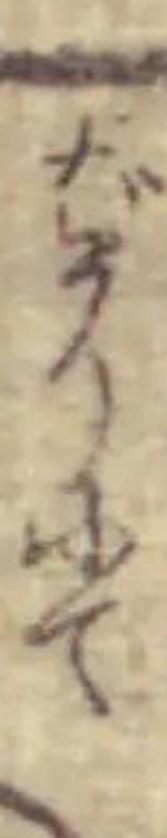ばかりにて
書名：化物敵討 2巻
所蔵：国立国会図書館 National Diet Library, JAPAN
